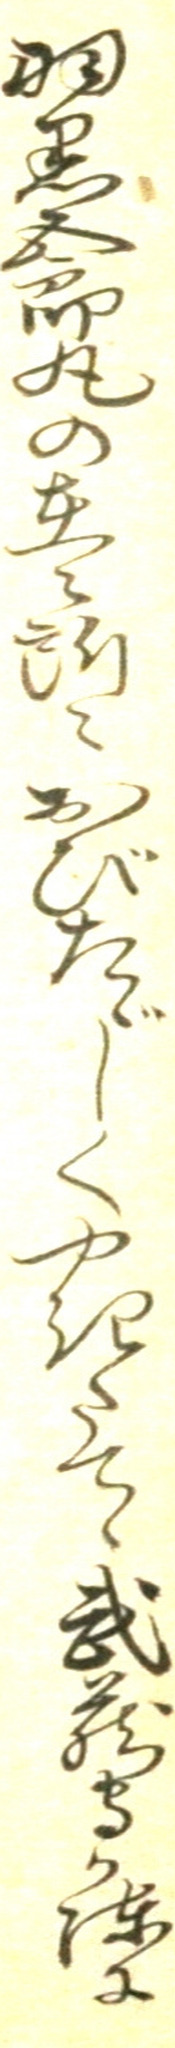羽黒五郎丸の在々所々おびたゞしくやきたてゝ武蔵守か陣に
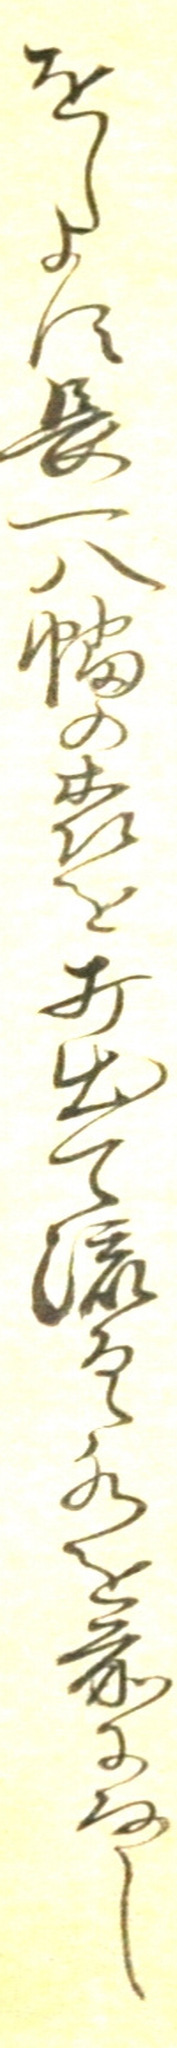をしよす長一八幡の森を打出て流るゝ水を前になし
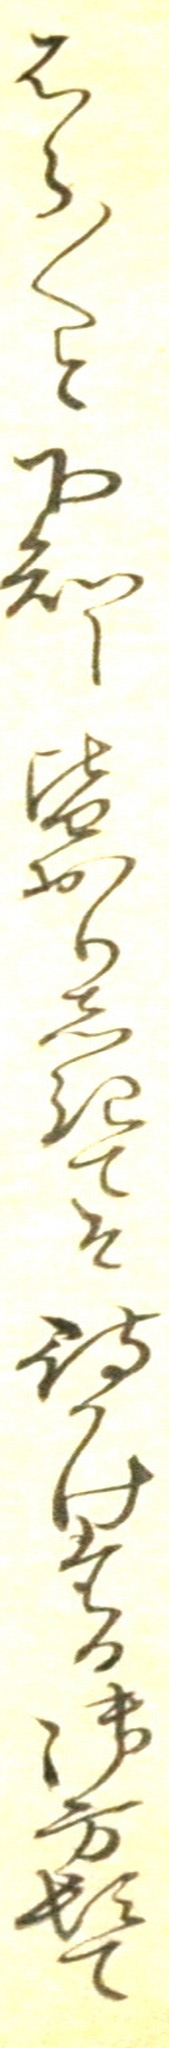はら〳〵と下知し皆おりしきてそ待かけたる御方頓て
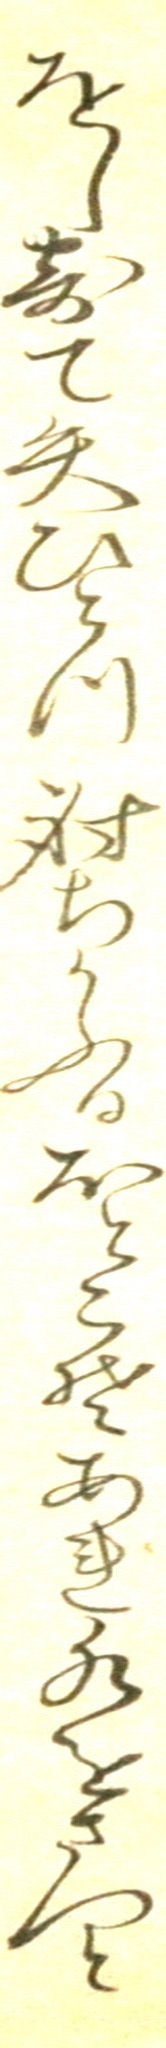をし寄て矢ひとつ射ちかふるほとこそあれ水をさつと
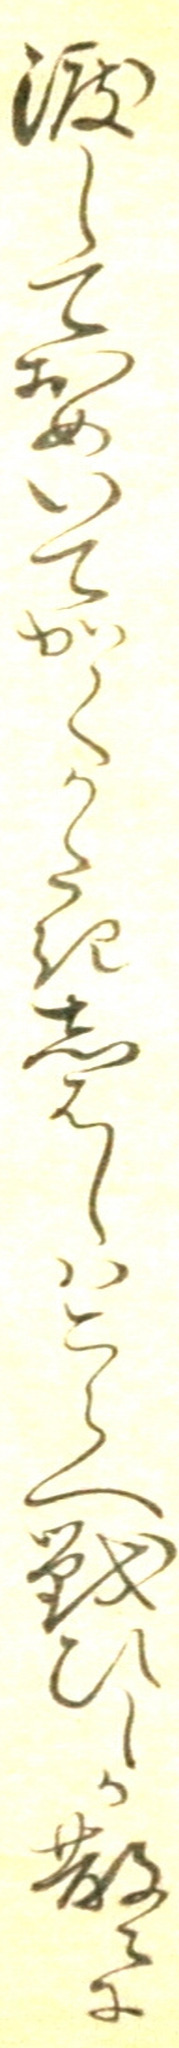渡しておめいてかくかたきしはしはこらへ戦ひしか散々に
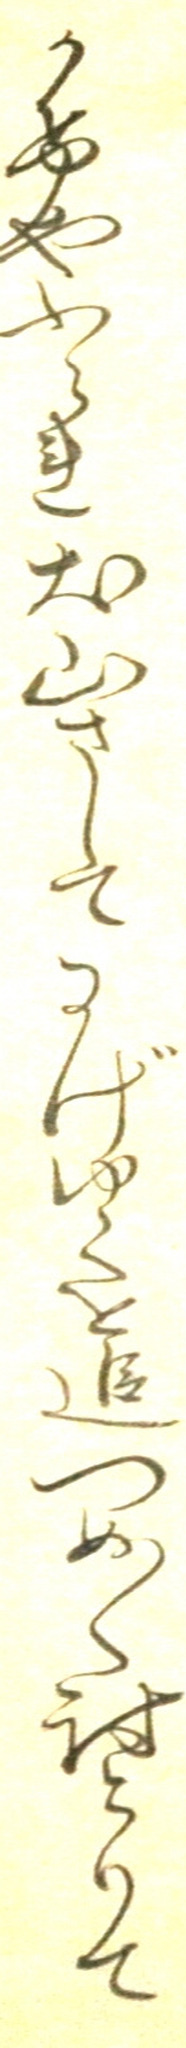かけやふられ犬山さしてにげゆくを追つめ〳〵討とりて
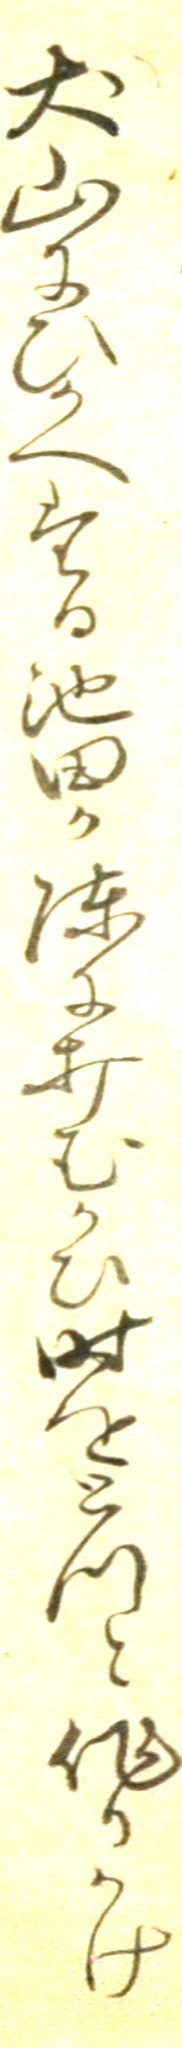犬山にひかへたる池田か陣に打むかひ時をとつと作りかけ
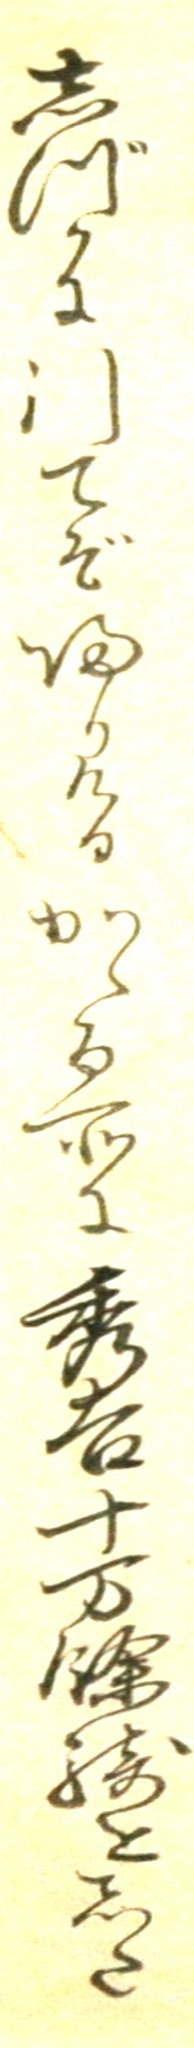しづかに引てぞ帰りけるかゝる所に秀吉十万余騎をした
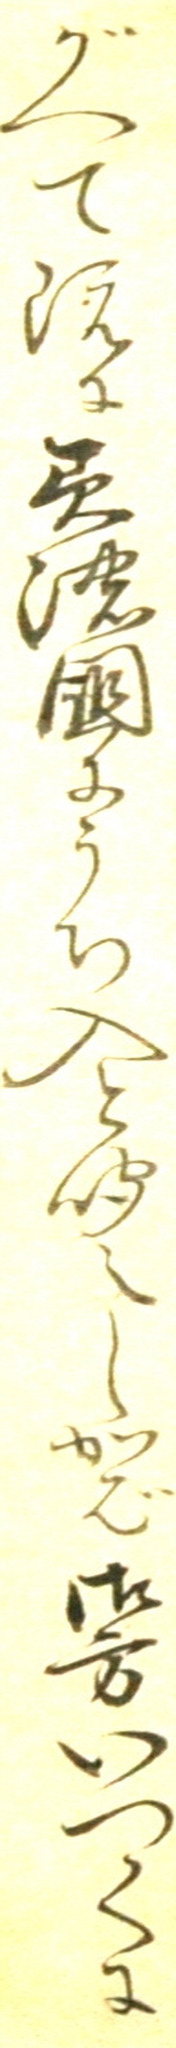がへて既に美濃国にうち入と聞えしかば御方いつくに
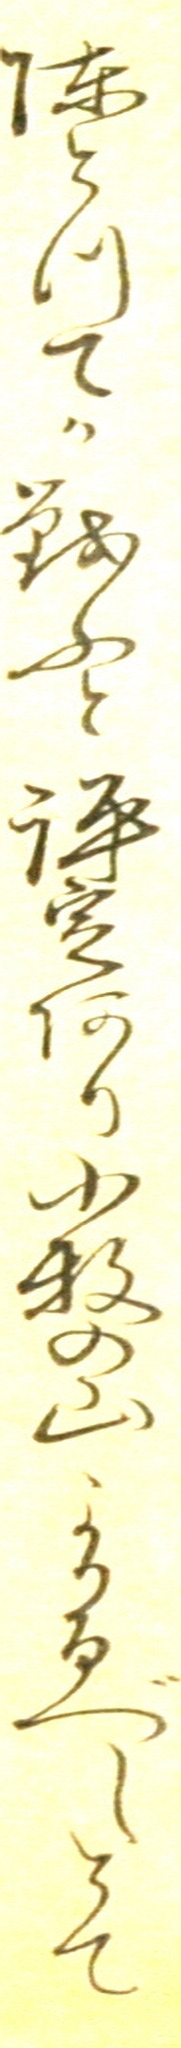陣とつてか戦ふと評定あり小牧の山よかるべしとて

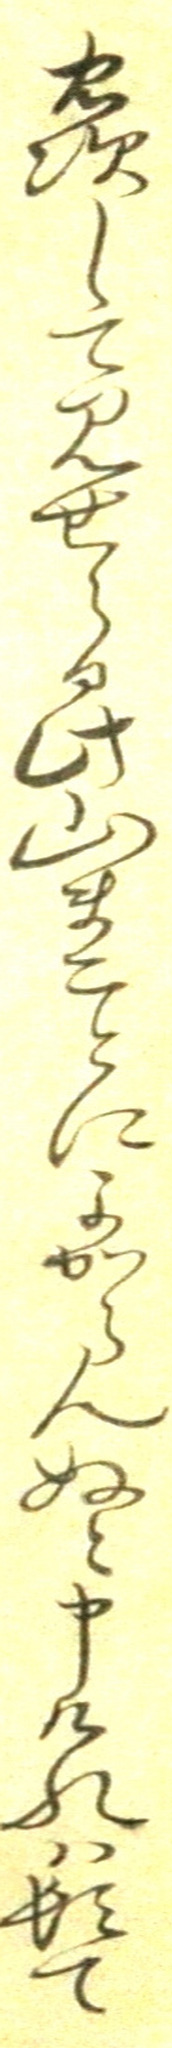忠次して見せらる此山まことによからんぬと申けれは頓て
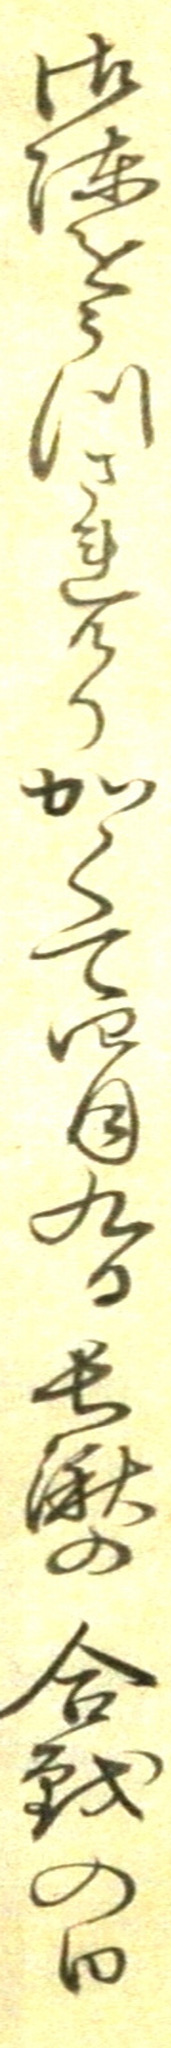御陣をうつされけりかくて四月九日長湫の合戦の日
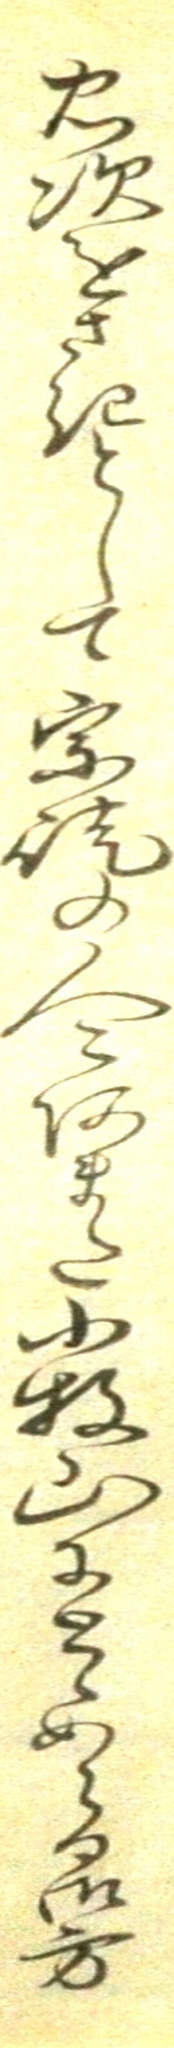忠次をさきとして宗徒の人々あまた小牧山にとゝめらる御方
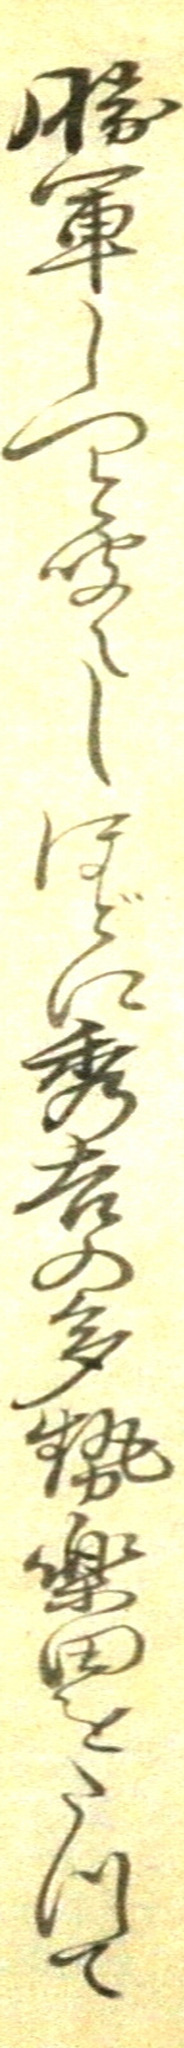勝軍しつと聞えしほどに秀吉の多勢楽田をたつて
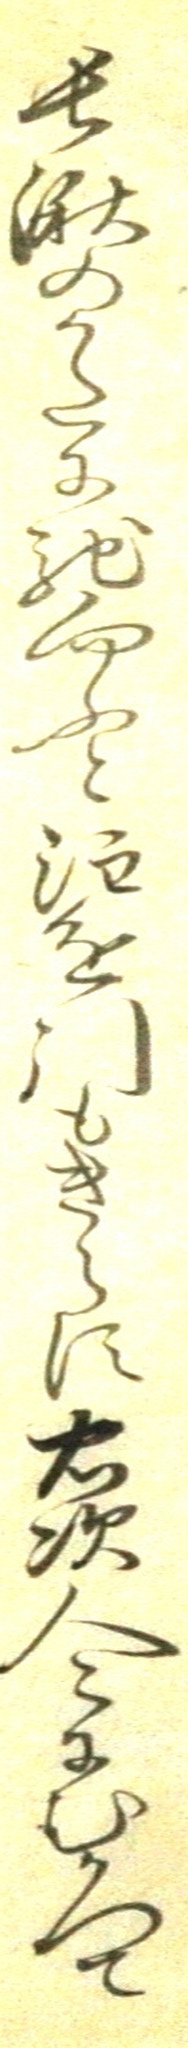長湫のかたに馳向ふと注進引もきらす忠次人々にむかつて
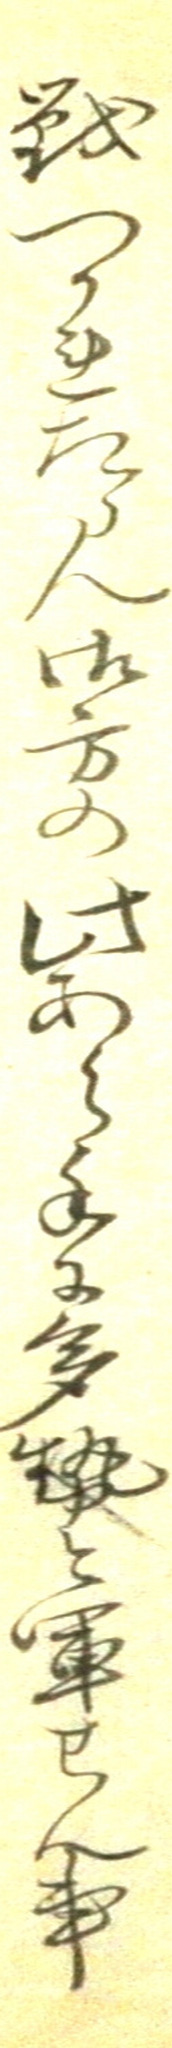戦つかれたらん御方の此あら手に多勢と軍せん事
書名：藩翰譜（四・上）
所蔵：伊那市立高遠町図書館・合同会社AMANE
